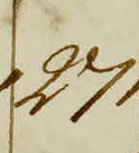27
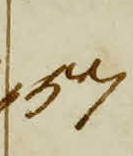57
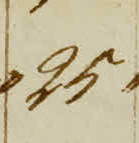25
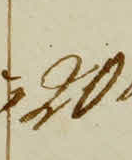20
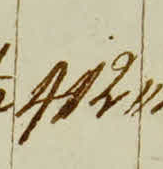412
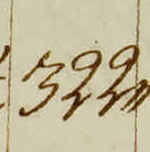322
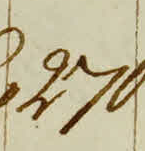270
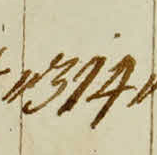314
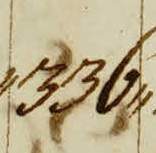336
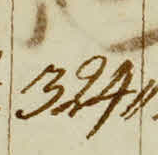324
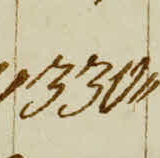330
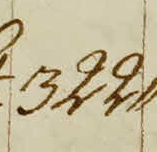322
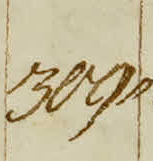309
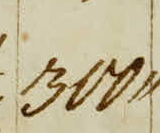300
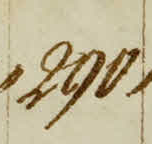290
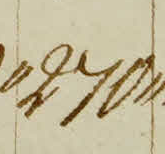270
